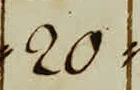20
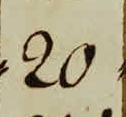20
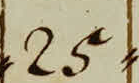25
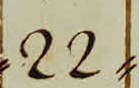22
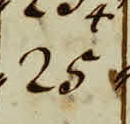25
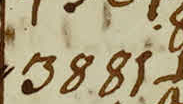3881
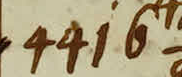4416
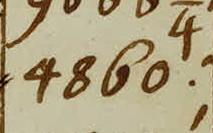4860
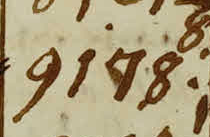9178
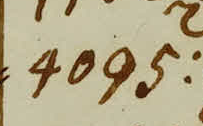4095
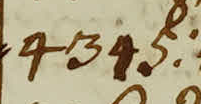4354
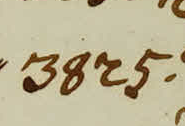3825
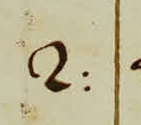2:
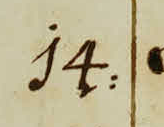14:
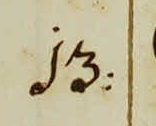13:
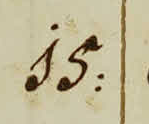15:
